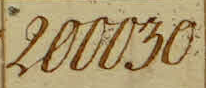200030
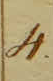4.
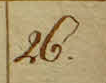26.
